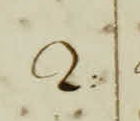2:
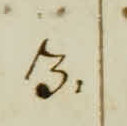3:
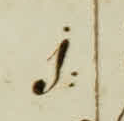1:
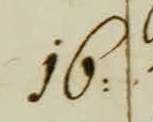16:
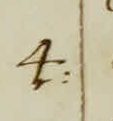4:
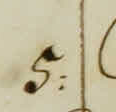5:
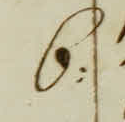6:
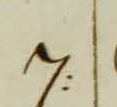7:
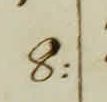8:
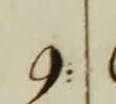9:
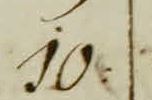10:
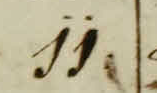11:
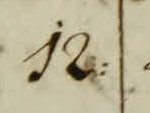12:
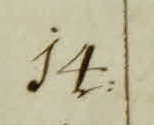14:
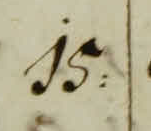15:
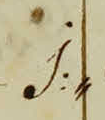1:
